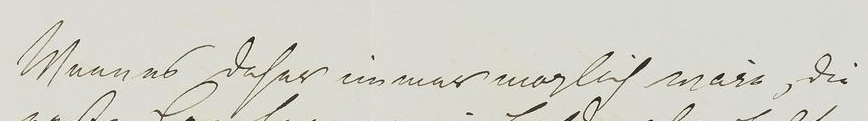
Wenn es daher immer möglich wäre, die
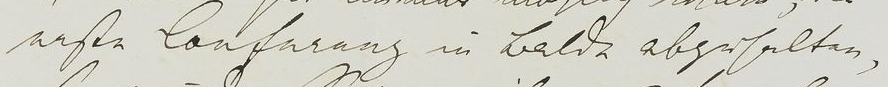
erste Conferenz in Bälde abzuhalten,
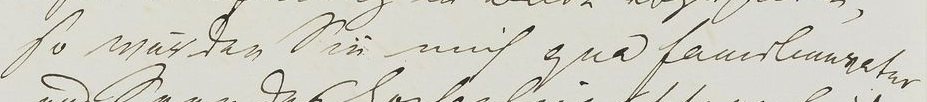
so würden Sie mich qua Familienvater
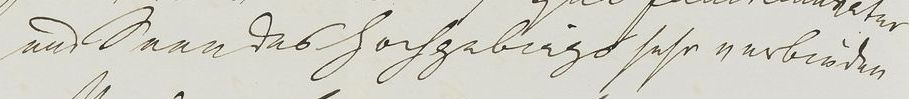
und Senn des Hochgebirgs sehr verbinden.
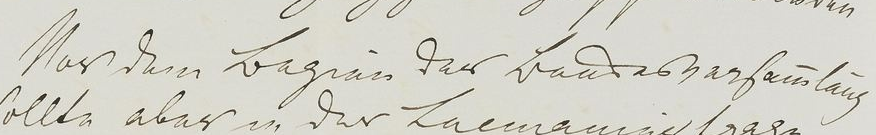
Vor dem Beginn der Bundesversammlung
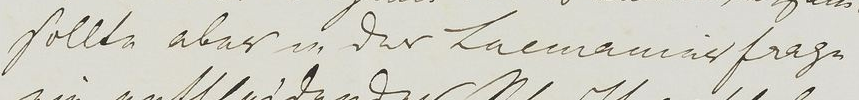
sollte aber in der Lucmanierfrage
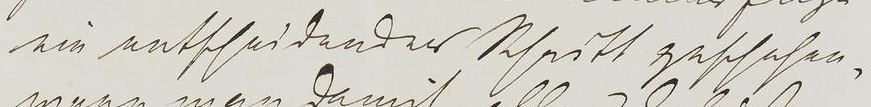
ein entscheidender Schritt geschehen,
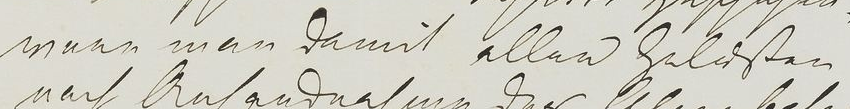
wenn man damit allen Gelüsten
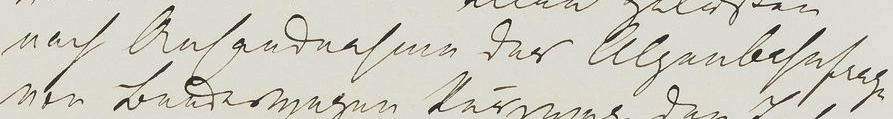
nach Anhandnahme der Alpenbahnfrage
